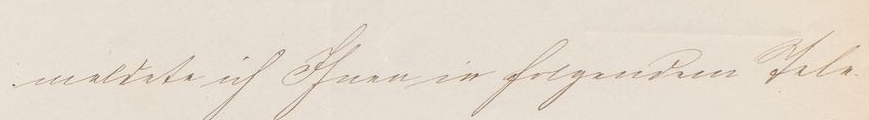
meldete ich Ihnen in folgendem Tele-
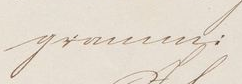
gramm:
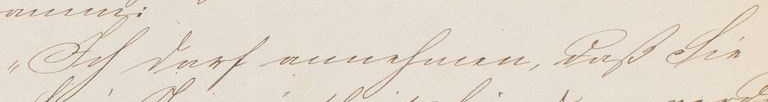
«Ich darf annehmen, daß Sie
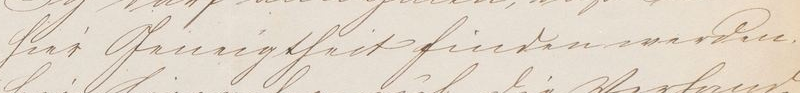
hier Geneigtheit finden werden.
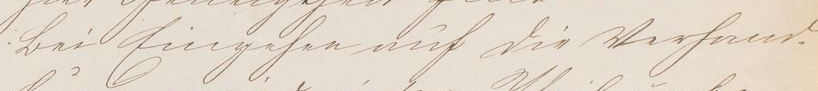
Bei Eingehen auf die Verhand-
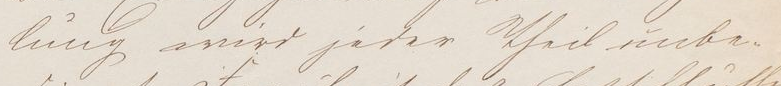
lung wird jeder Theil unbe-
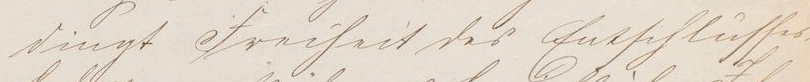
dingt Freiheit des Entschlusses
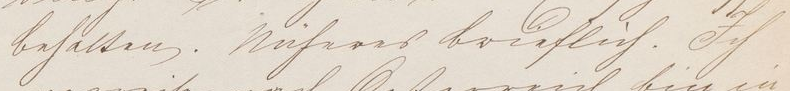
behalten. Näheres brieflich. Ich
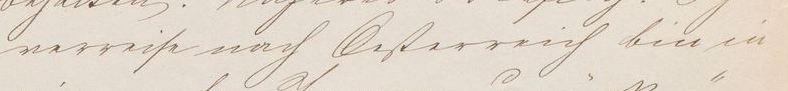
verreise nach Oesterreich bin in
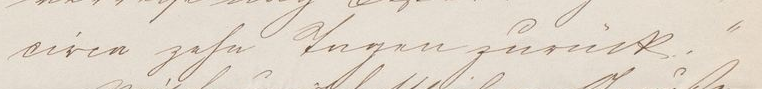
circa zehn Tagen zurück.»
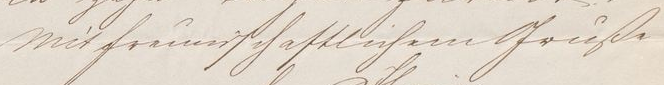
Mit freundschaftlichem Gruße
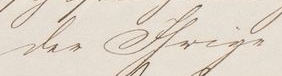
der Ihrige
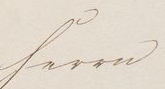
Herrn
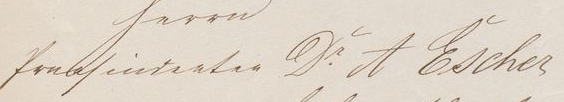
Praesidenten Dr A Escher
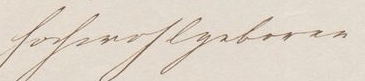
Hochwohlgeboren
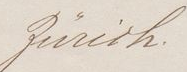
Zürich.
